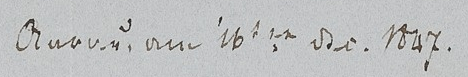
Aarau, am 16ten Dec. 1847.
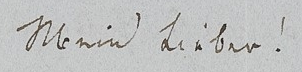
Mein Lieber!
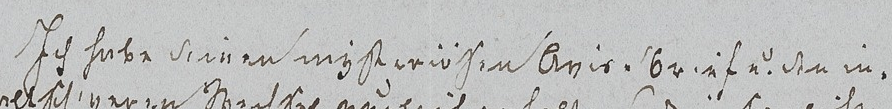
Ich habe deinen mysteriösen Avis-Brief u. den in-
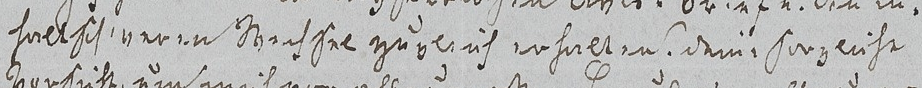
haltschweren Wechsel zugleich erhalten. Deine sorgliche
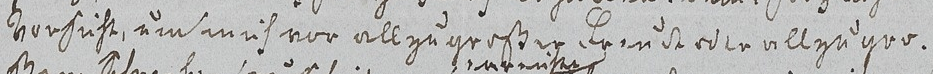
Vorsicht, um mich vor allzu großer Freude oder allzu gro-
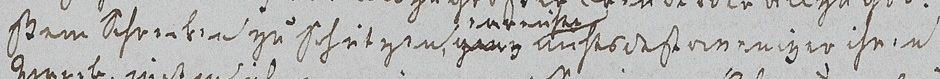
ßem Schrecken zu schützen, genz erreichte nichts desto weniger ihren
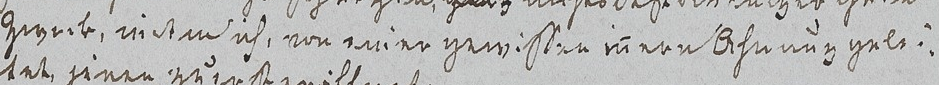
Zweck, indem ich, von einer gewissen innern Ahnung gelei-
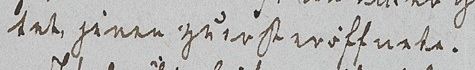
tet, jenen zuerst eröffnete.
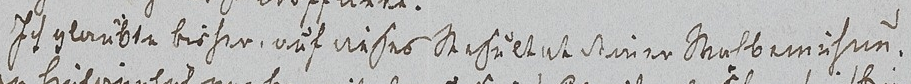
Ich glaubte bisher, auf dieses Resultat deiner Wahbemühun-
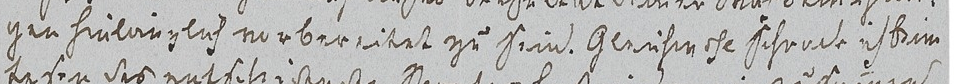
gen hinlänglich vorbereitet zu sein. Gleichwohl schrack ich beim
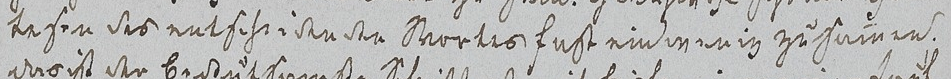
Lesen des entscheidenden Wortes fast ein wenig zusammen.
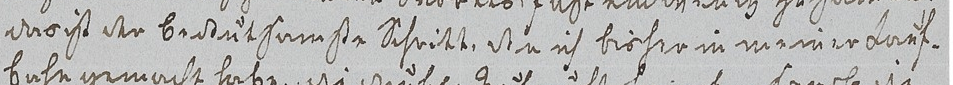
Das ist der bedeutsamste Schritt, den ich bisher in meiner Lauf-
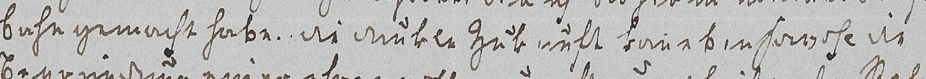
bahn gemacht habe. Die dunkle Zukunft kann ebensowohl die
